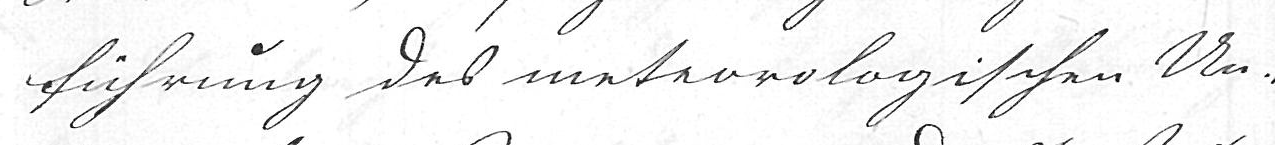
führung des meteorologischen Un-
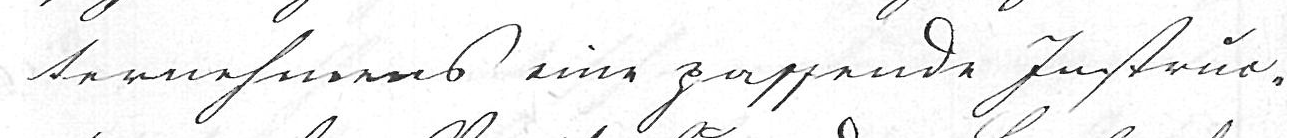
ternehmens eine passende Instruc-
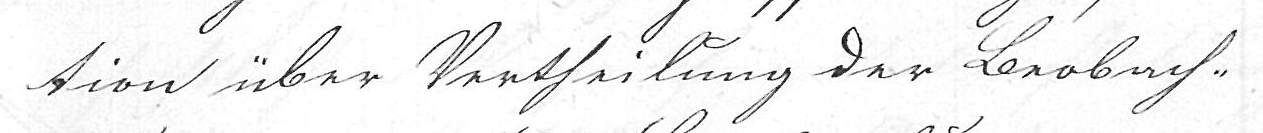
tion über Vertheilung der Beobach-
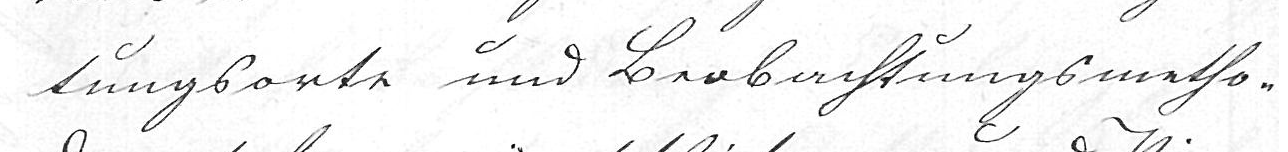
tungsorte und Beobachtungsmetho-
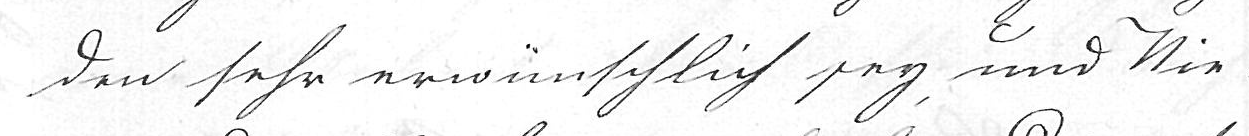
den sehr erwünschlich sey und Nie-
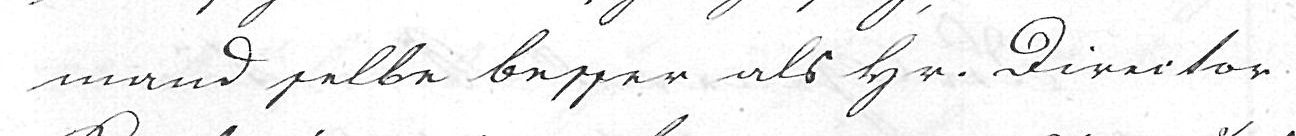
mand selbe besser als Hr. Director
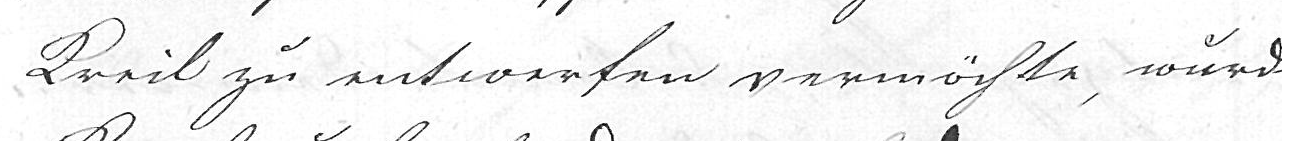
Kreil zu entwerfen vermöchte, wurde
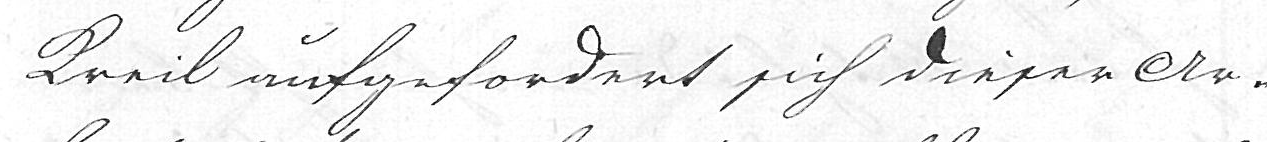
Kreil aufgefordert sich dieser Ar-
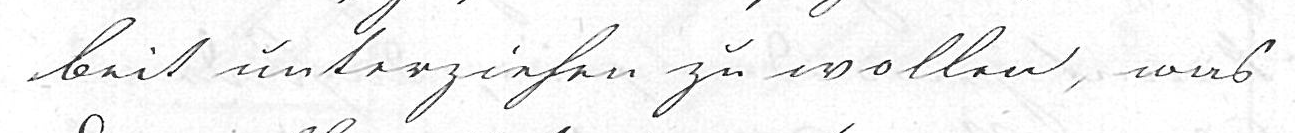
beit unterziehen zu wollen, was
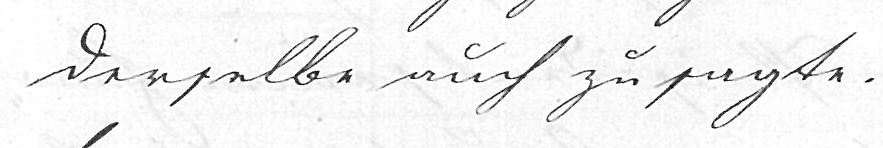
derselbe auch zusagte.
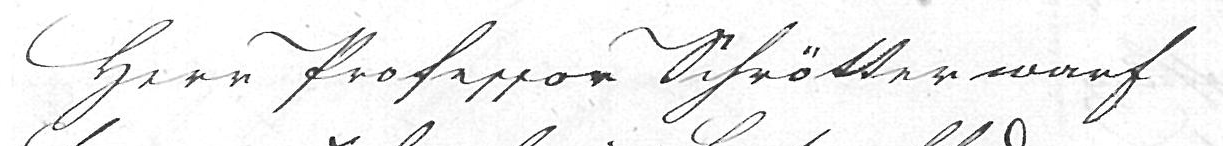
Herr Professor Schrötter warf
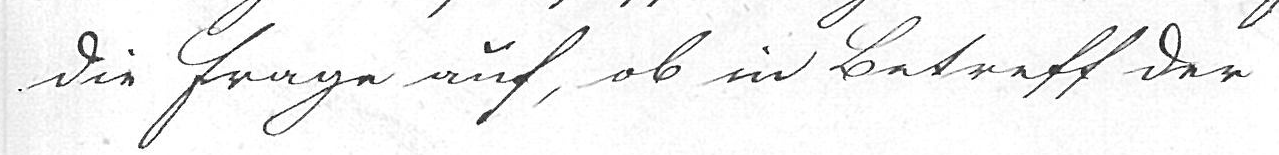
die Frage auf, ob in Betreff der
